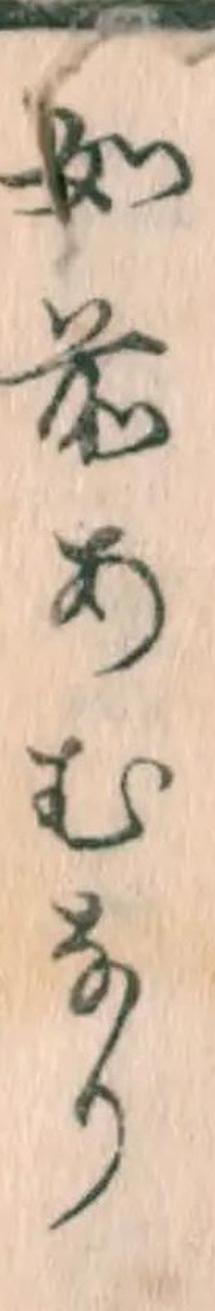如前あむなり
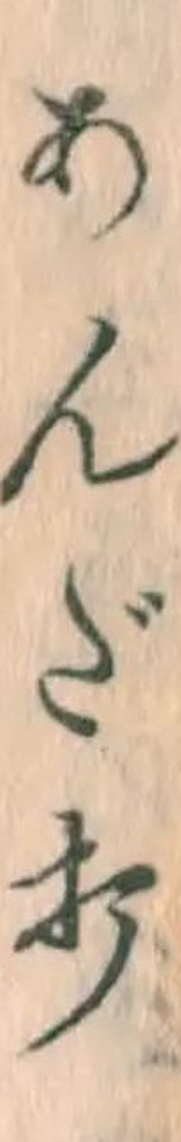あんだ打
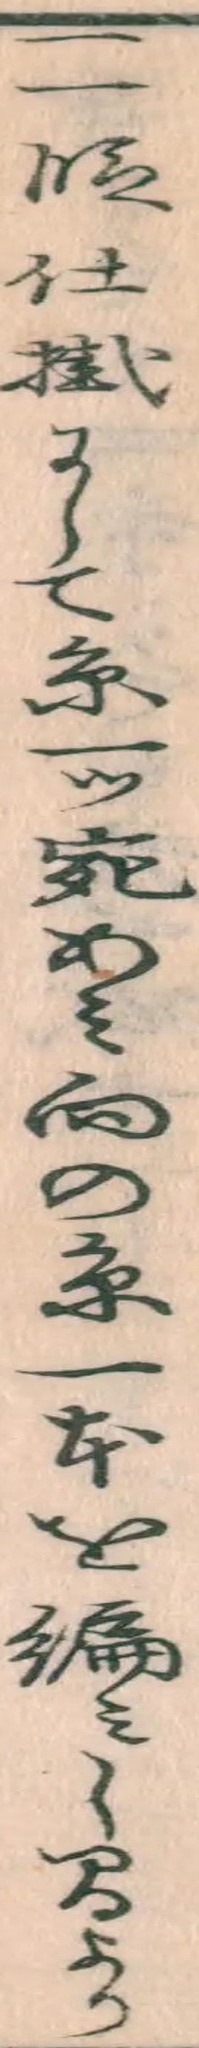一一段仕掛にして糸一ッ宛あみ向の糸一本を編みし間より
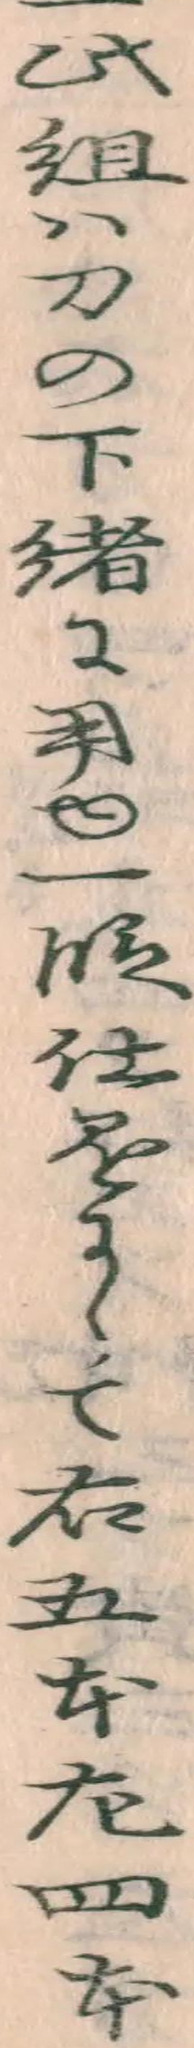一此組は刀の下緒に用ゆ一段仕懸にして右五本左四本
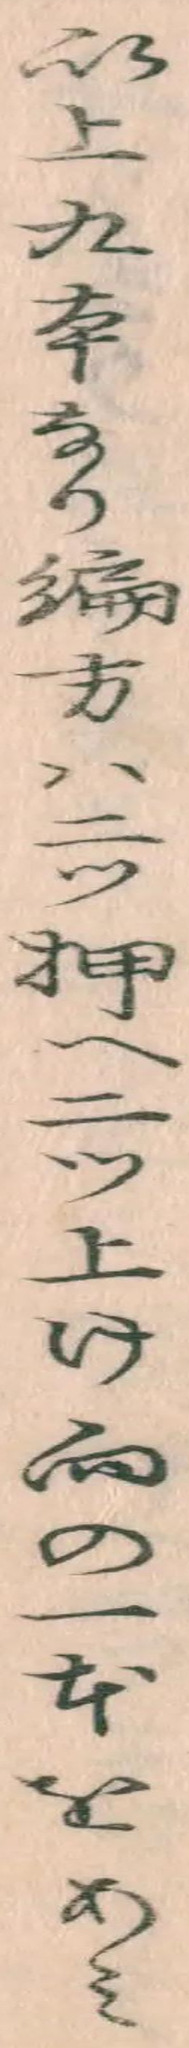以上九本なり編方は二ッ押へ二ッ上け向の一本をあみ
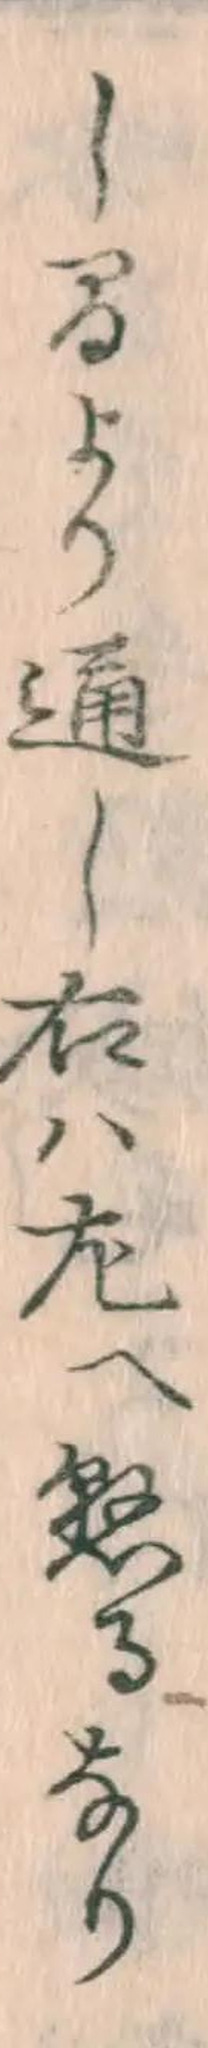し間より通し右は左へ懸るなり
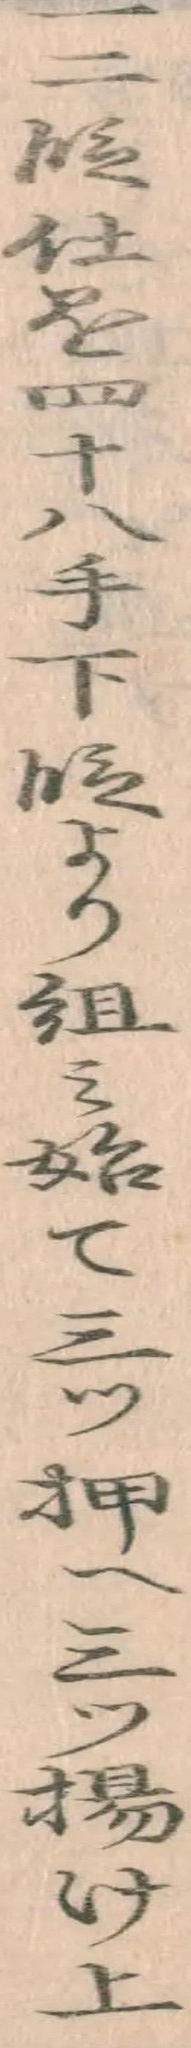一二段仕懸四十八手下段より組み始て三ッ押へ三ッ揚け上
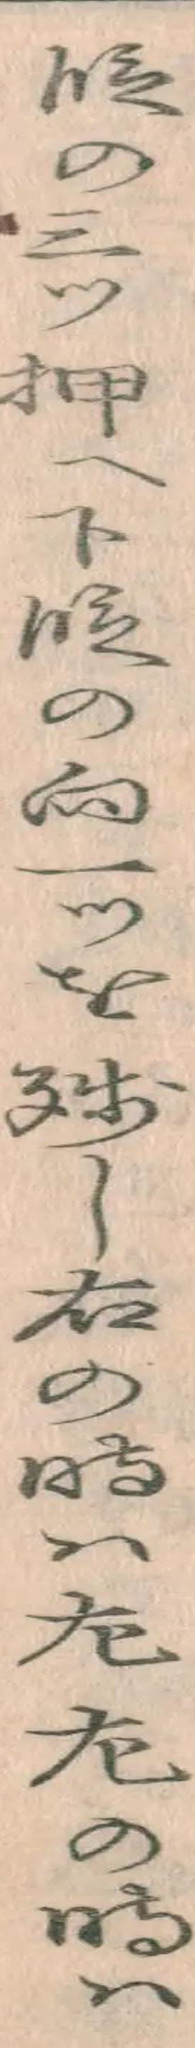段の三ッ押へ下段の向一ッを残し右の時は左左の時は
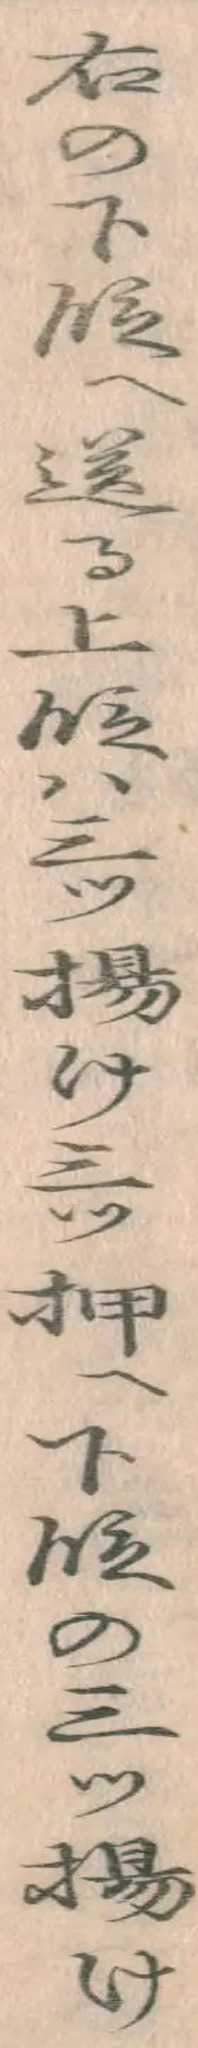右の下段へ送る上段は三ッ揚け三ッ押へ下段の三ッ揚け
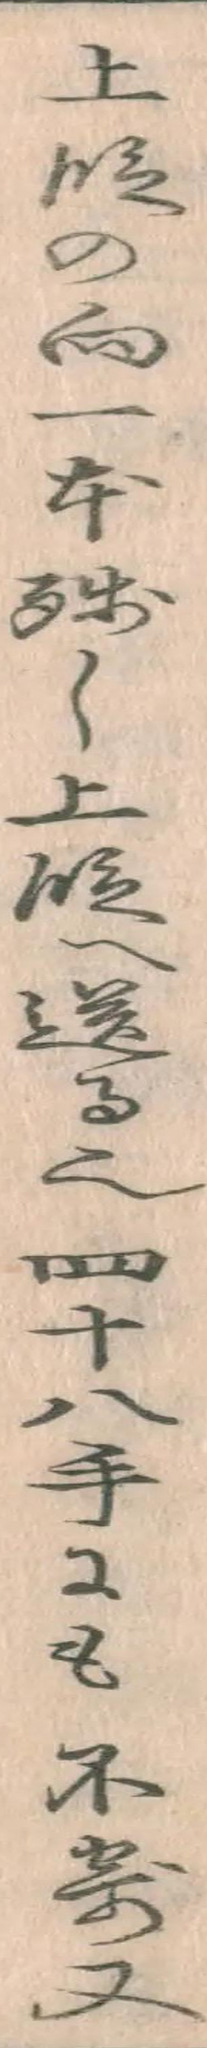上段の向一本残し上段へ送る也四十八手にも不寄又
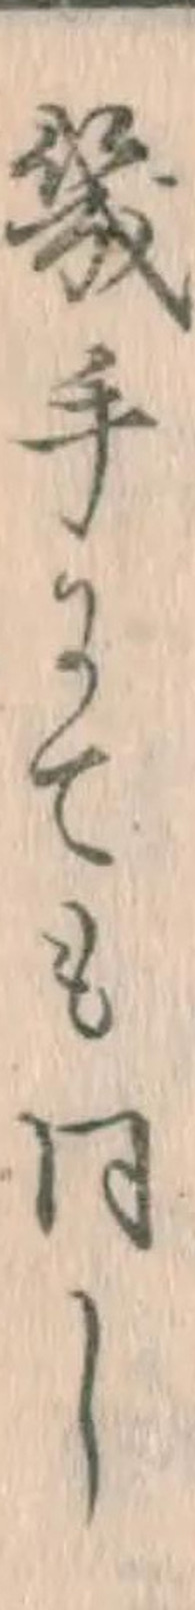幾手にても同し
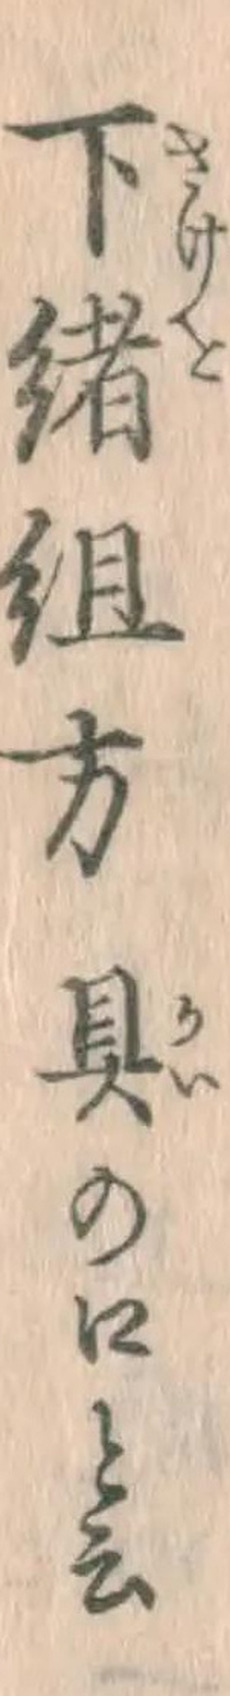下緒組方貝の口と云
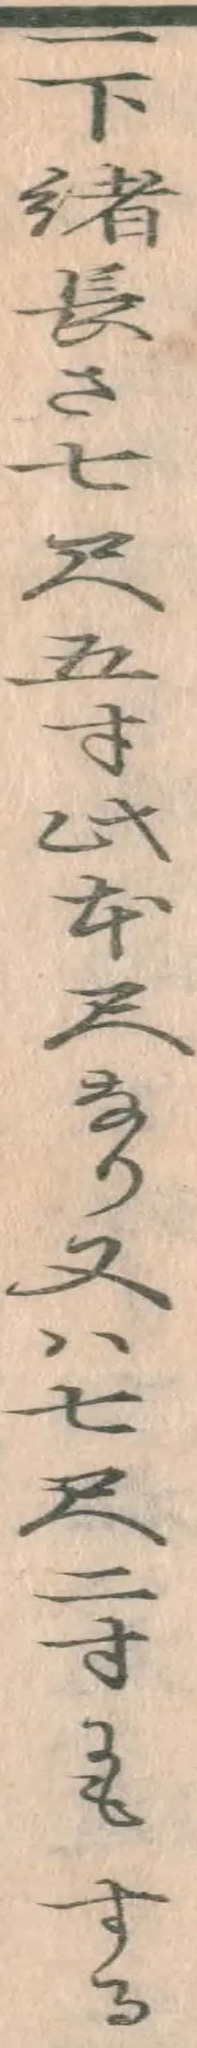一下緒長さ七尺五寸此本尺なり又は七尺二寸にもする
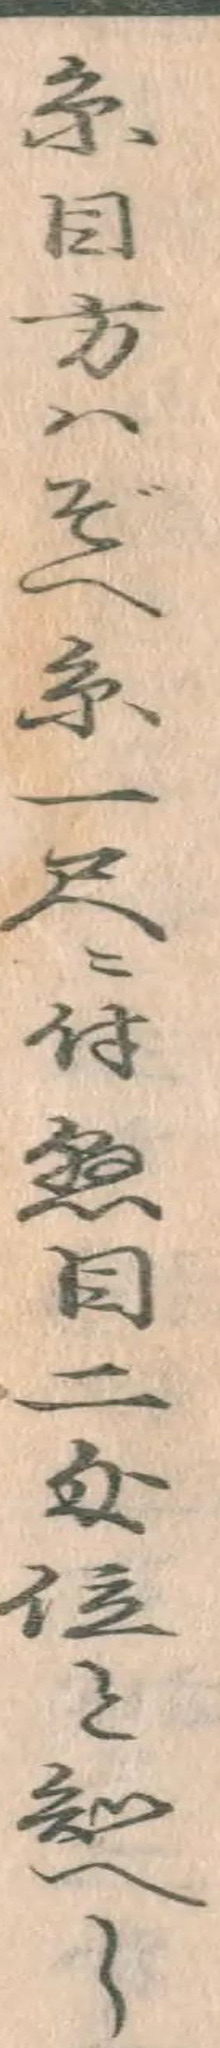糸目方はぞへ糸一尺に付懸目二匁位と知へし
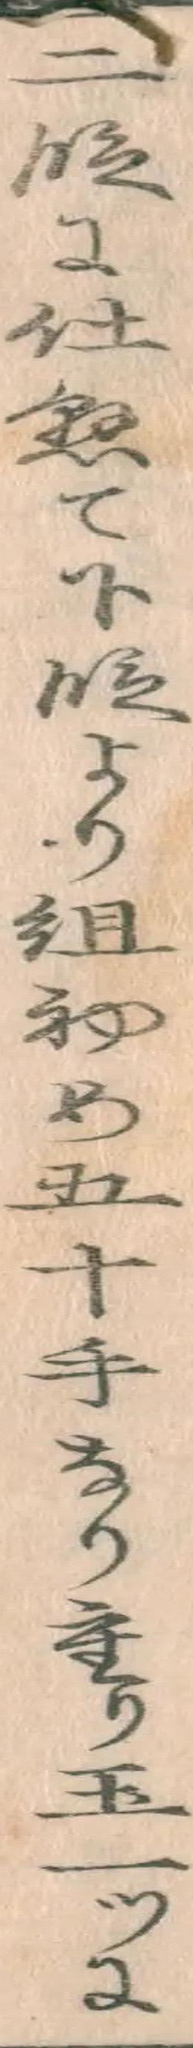一二段に仕懸て下段より組初め五十手なり重り玉一ッに
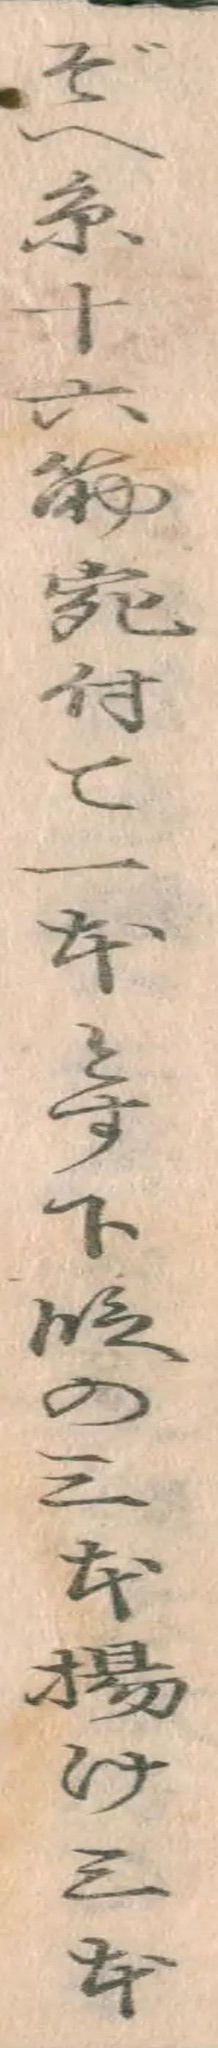ぞへ糸十六筋付て一本とす下段の三本揚け三本
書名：機織彙編 5巻. [2]
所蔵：国立国会図書館 National Diet Library, JAPAN
